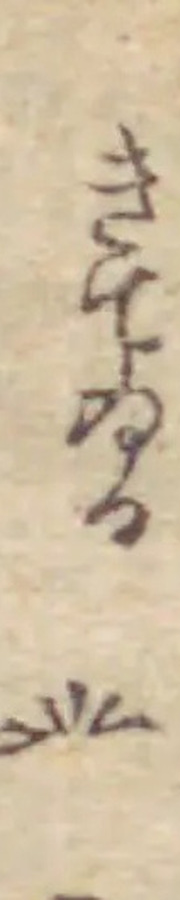きてゐる
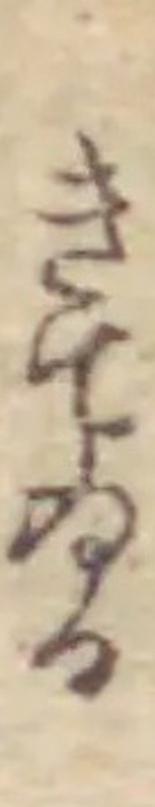きてゐる

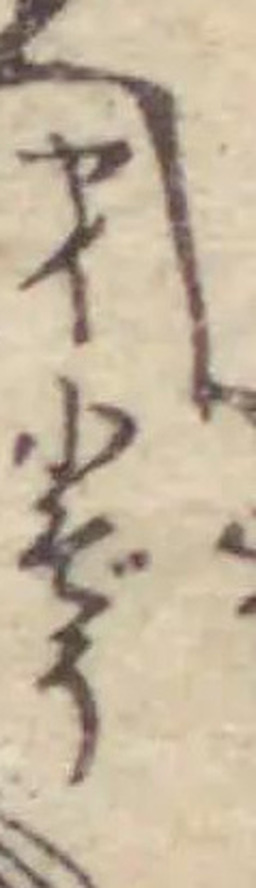ヤイ小ぞう
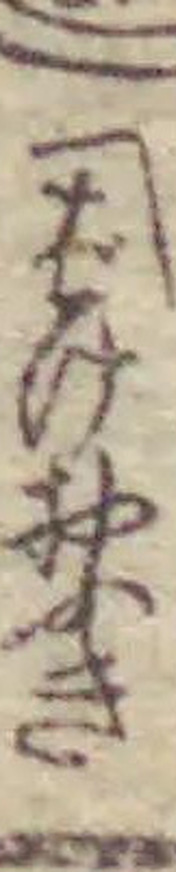〽ばけおふき
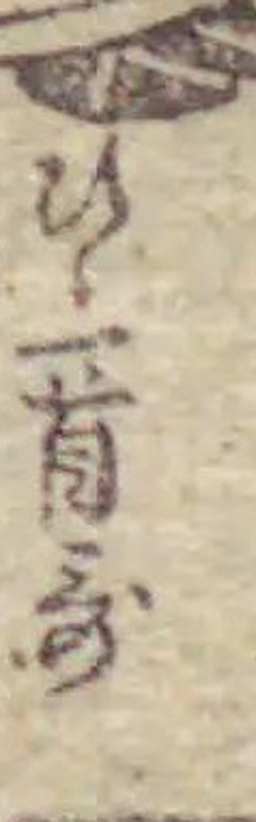ひゝ一首歌
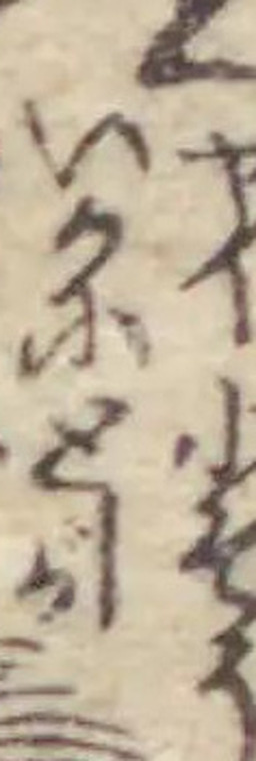いかにとしか
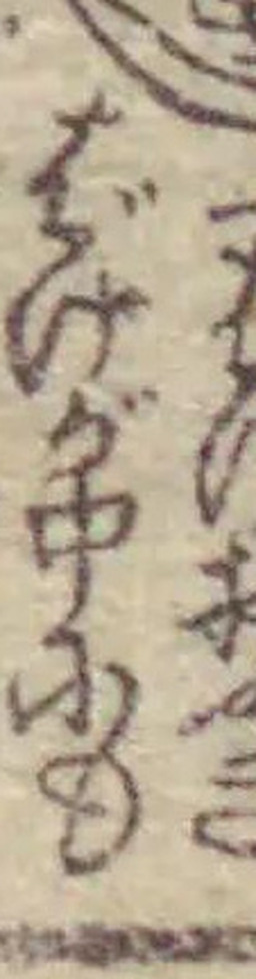ばけが中にも
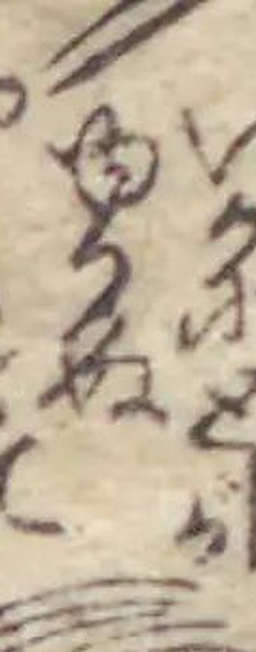ゆかぬ
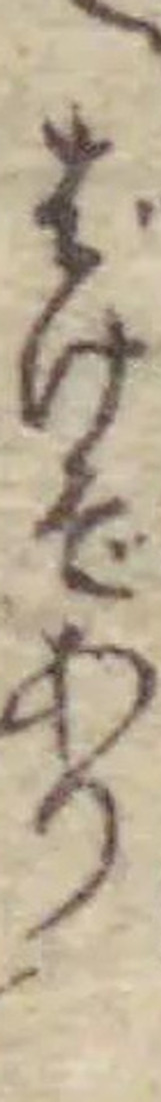ばけぞあり
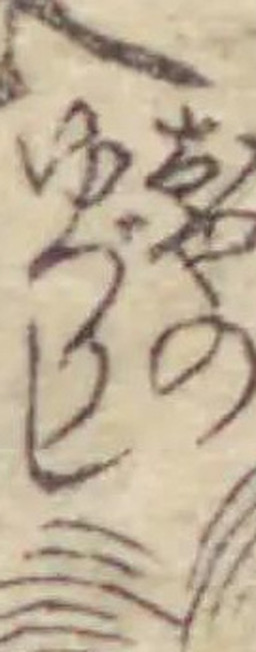ゆづりし
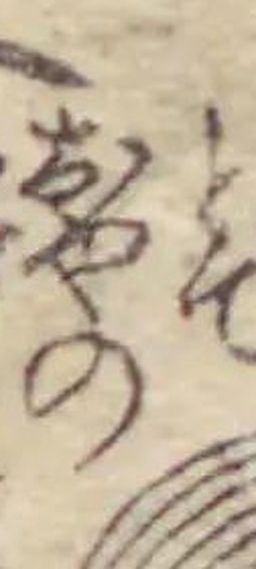おやの
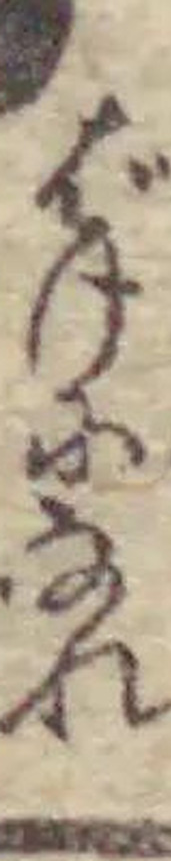ばけになれ
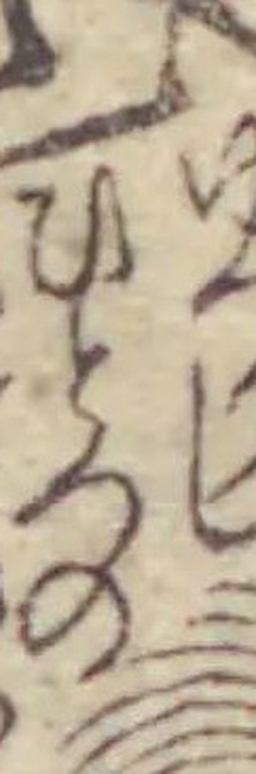ひとつの
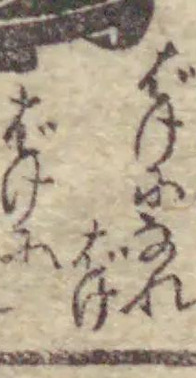ばけになれ
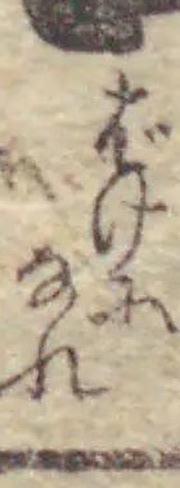ばけに
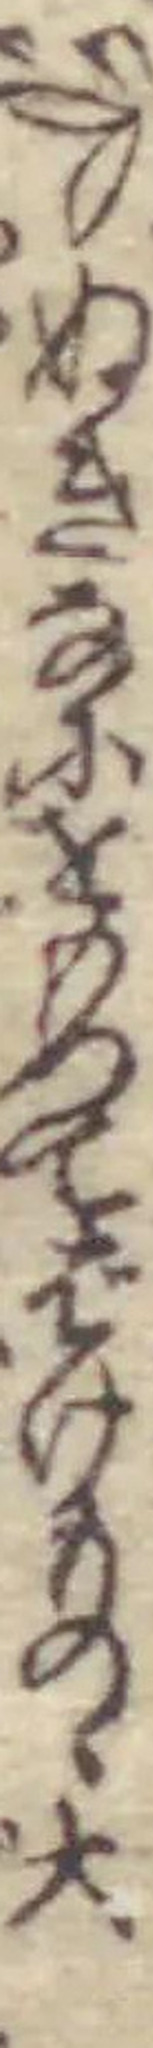ぬきなにをもつてばけものゝ大
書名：大昔化物双紙 2巻
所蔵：国立国会図書館 National Diet Library, JAPAN
